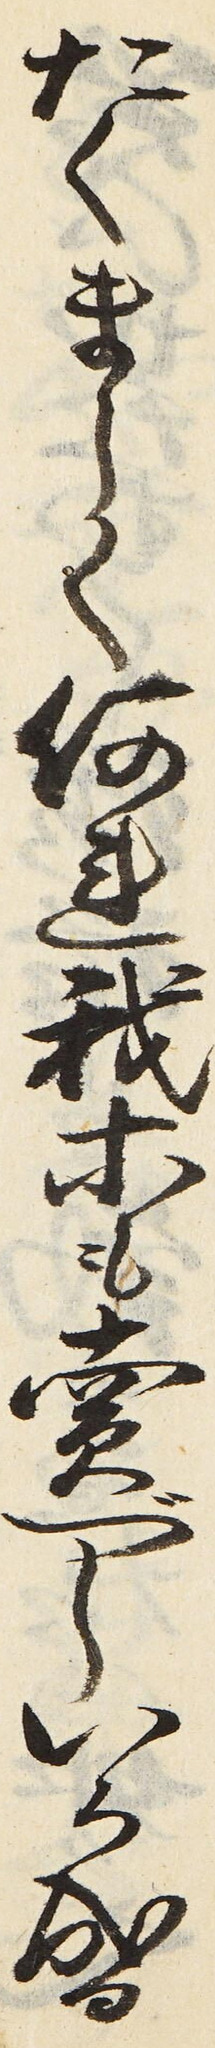たくましく何れ我等も売べしいか成る
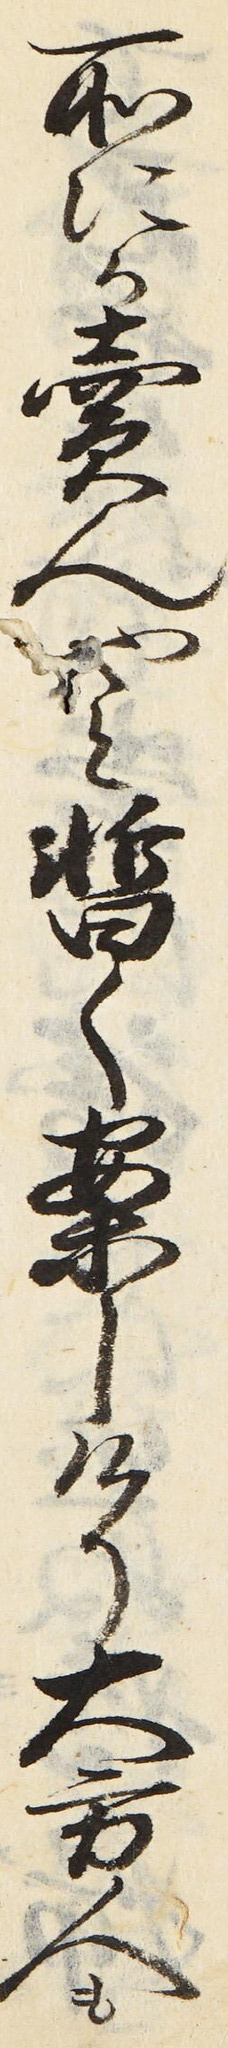所にか売んやと暫く案しけり大方人も
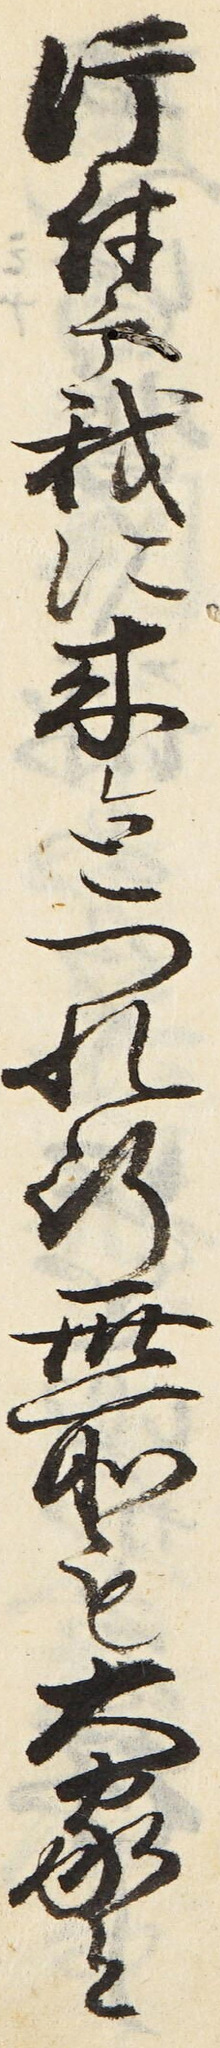行付け我に来れとつれ行此所も大家と
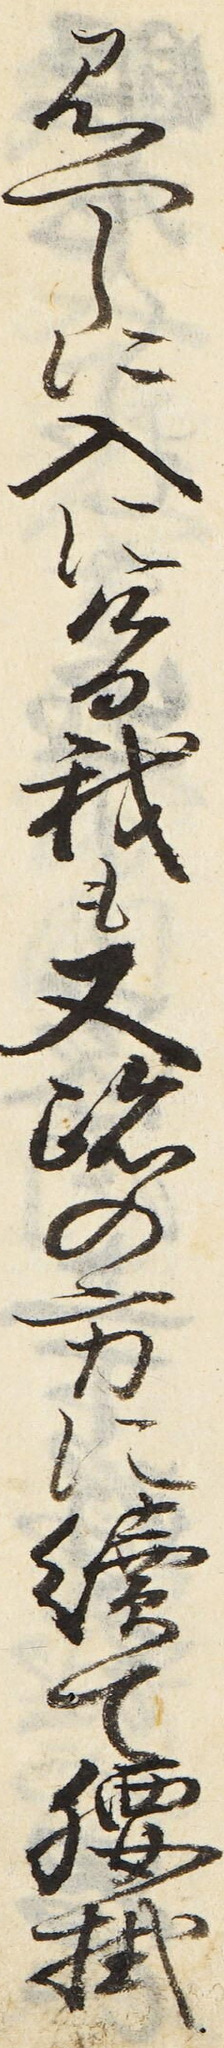見へしに入にける我も又跡の方に続て腰掛
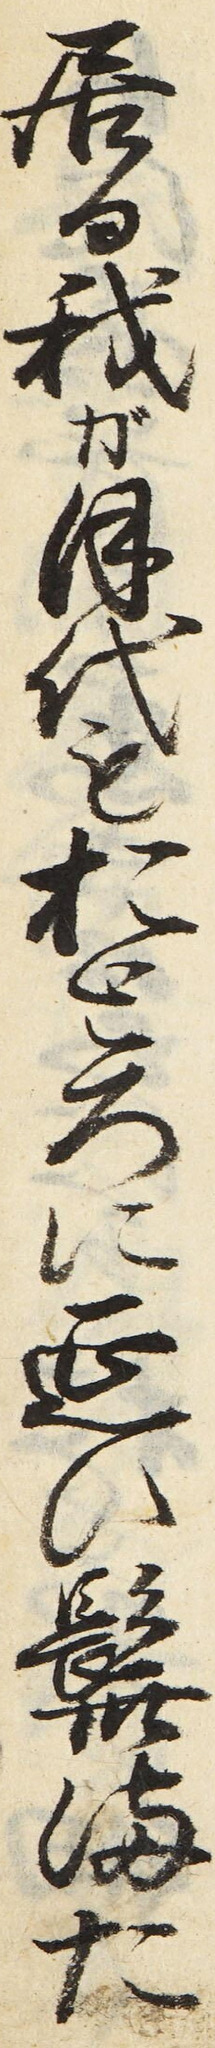居る我が月代もおとろに延ひ髭また

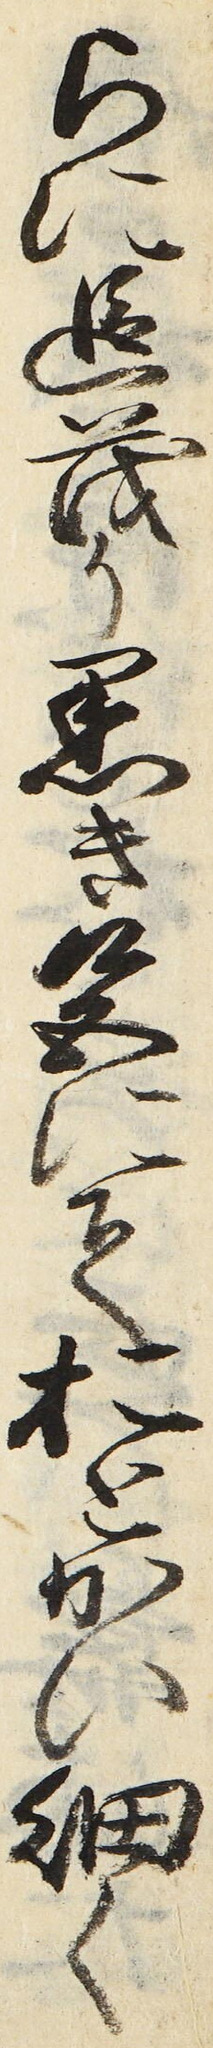らに追茂り黒き色にておとかひ細く
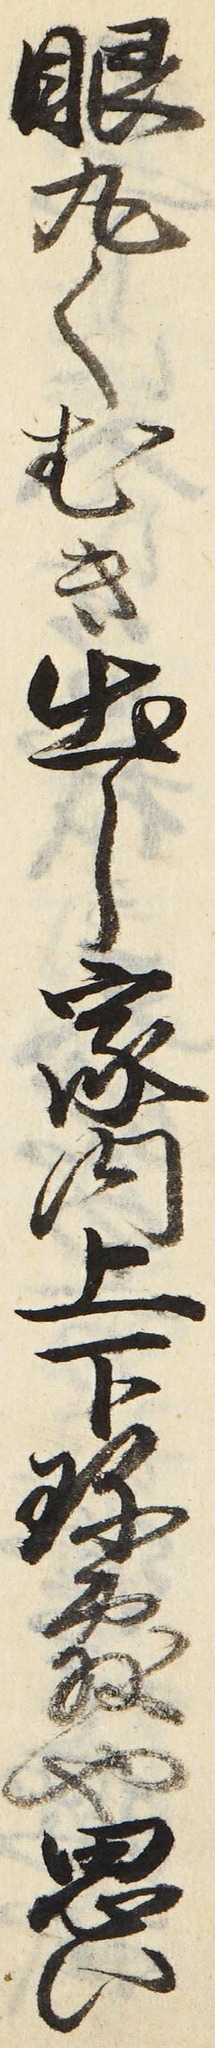眼丸くむき出し家内上下珎敷や思ひ
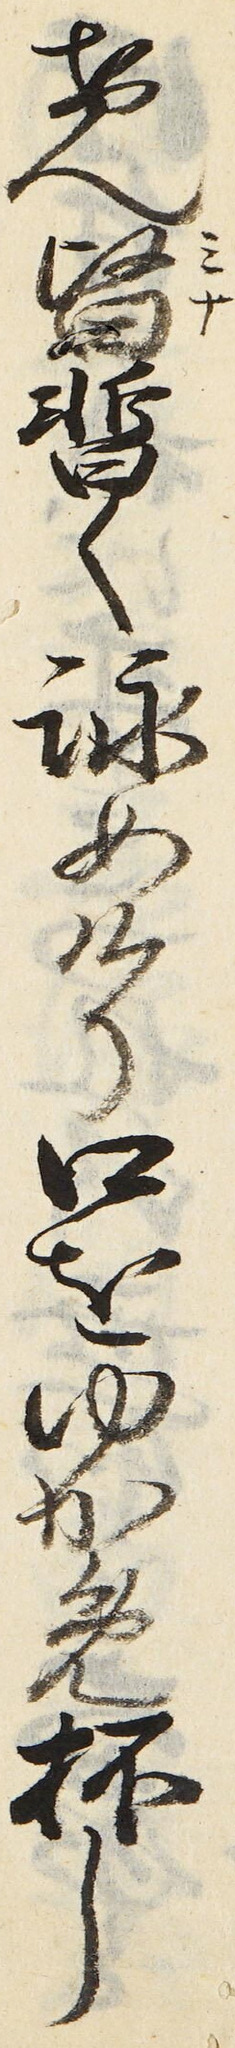けん皆暫く詠めけり口をゆかめ抔し
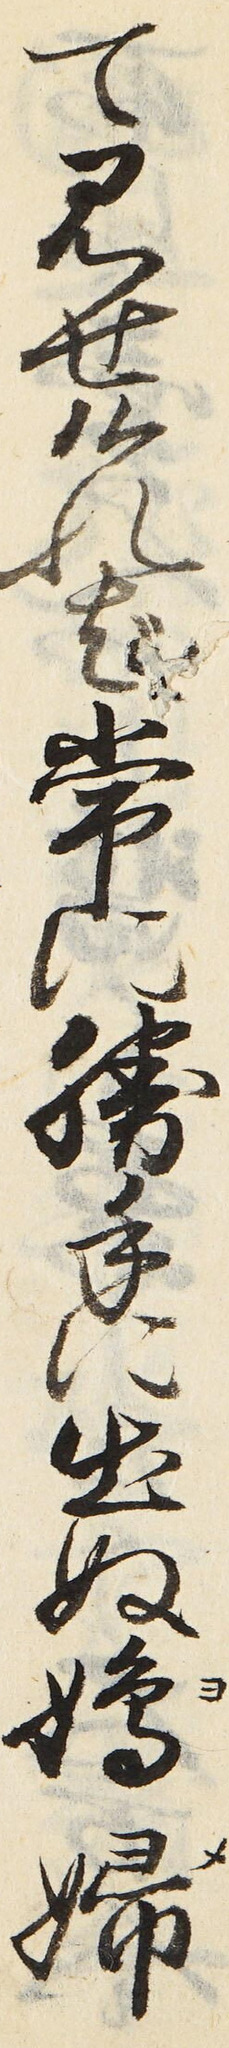て見せければ常に勝手に出ぬ婦
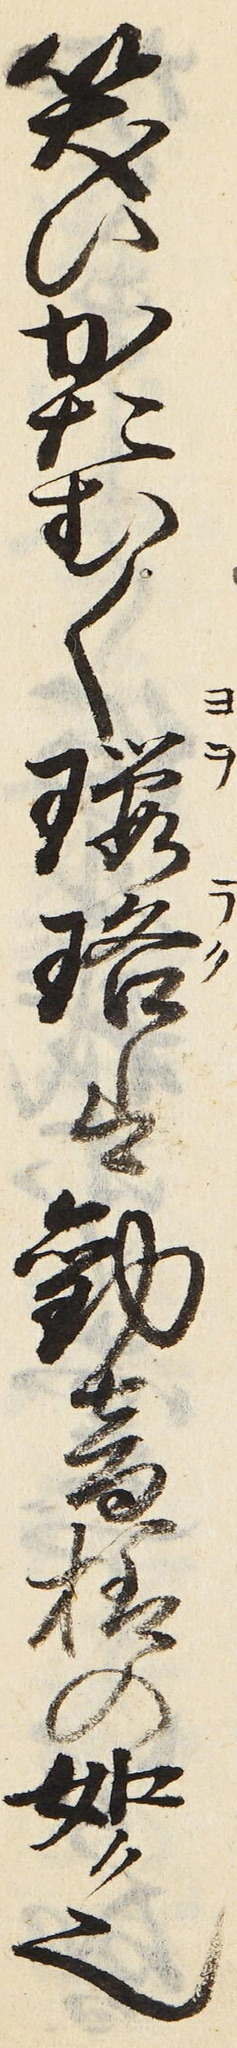笑ひかたむく瓔珞は観音様の如く也
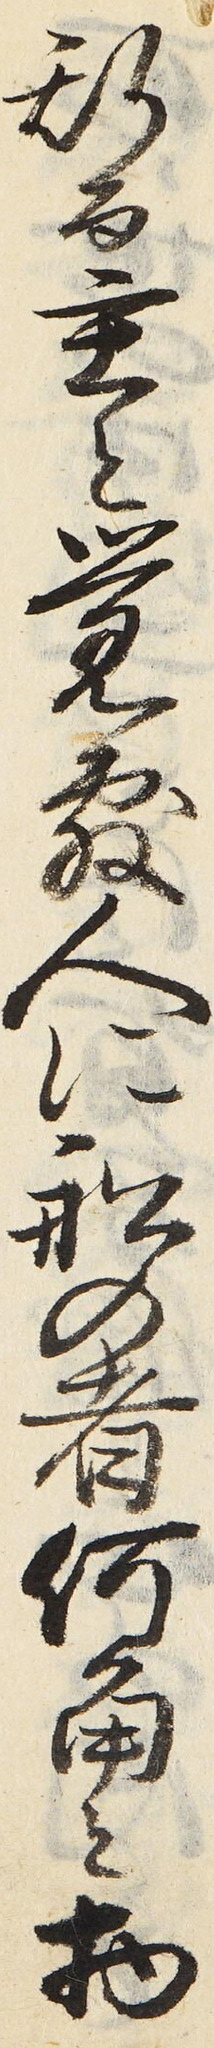斯而主と覚敷人に船の者何角と物
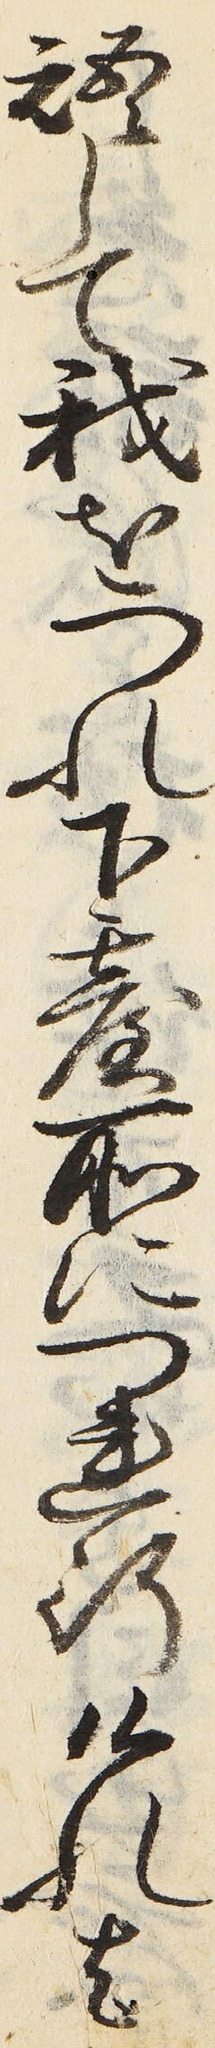語して我をつれ下台所につれ行ければ
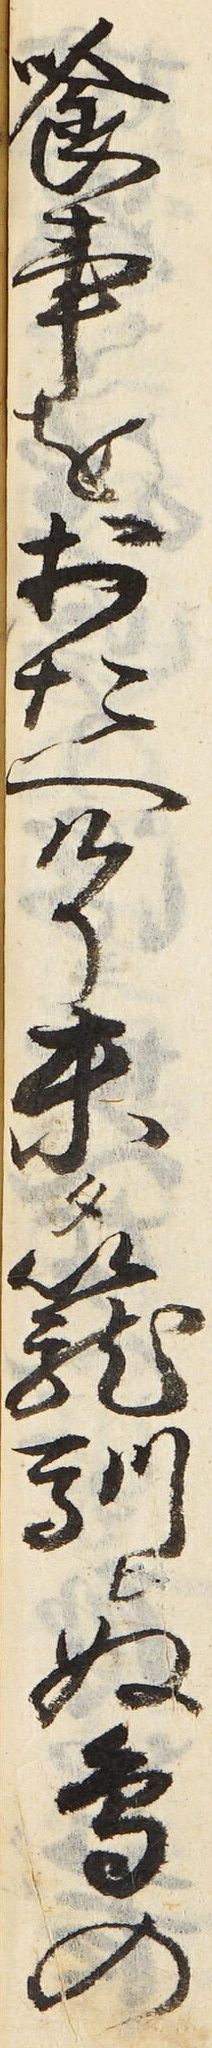喰事をおたへけり未た籠馴れぬ鳥の
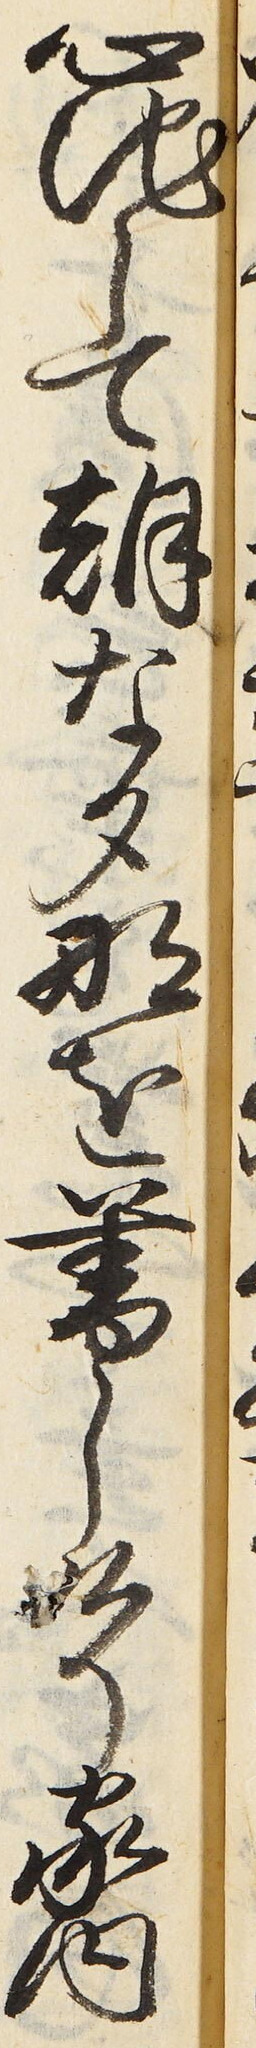心地して朝な夕なを暮しけり家内
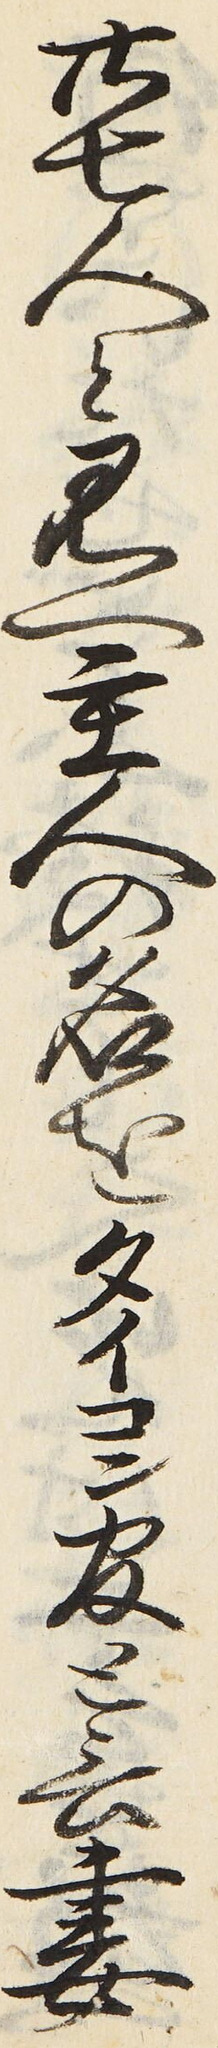廿七人と見へ主人の名をタイコン官と云妻
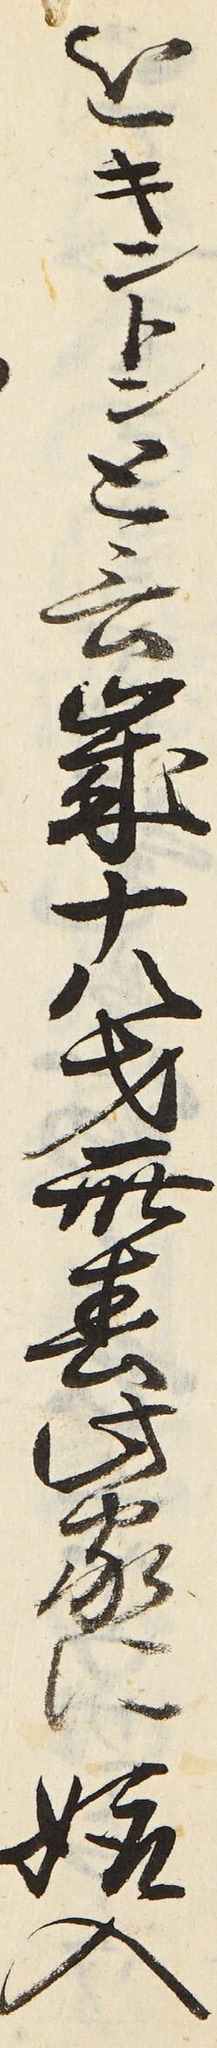をキントンと云歳十八才此春此家に娵入
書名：華夷九年録
